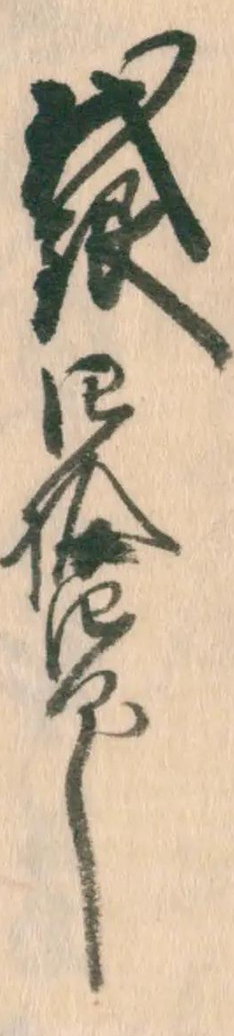代銀四拾四匁但壱人銀四匁
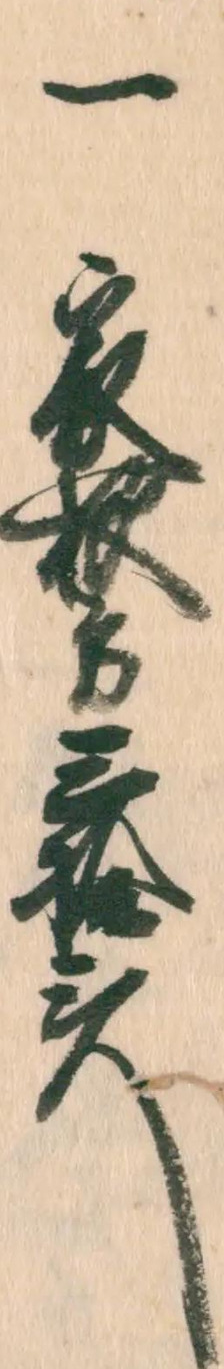一家根方三拾三人
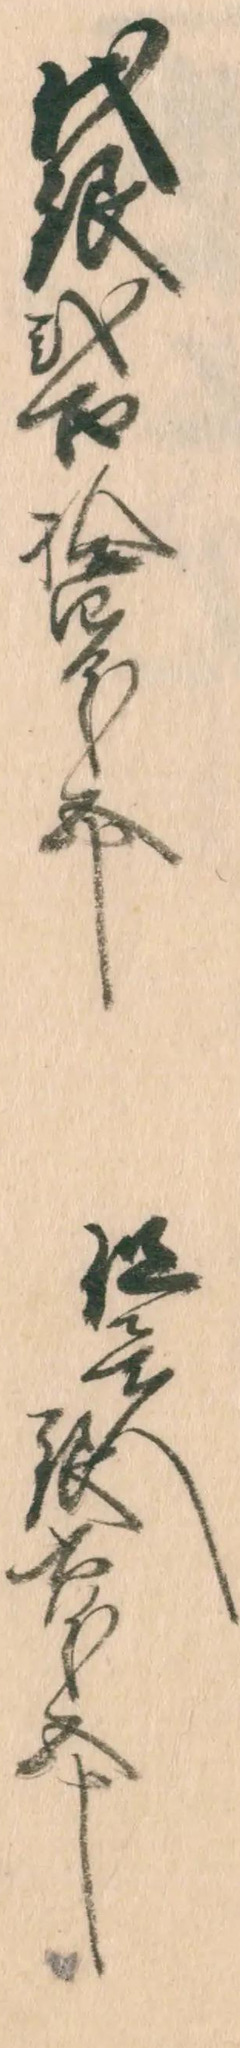代銀弐百拾四匁五分但壱人銀六匁五分
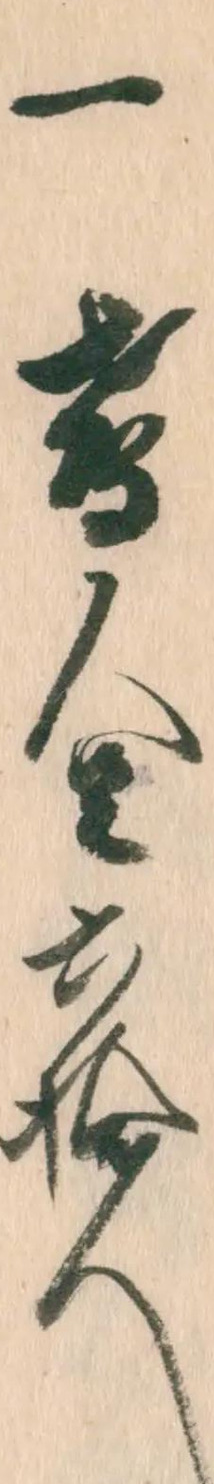一鳶人足六拾人

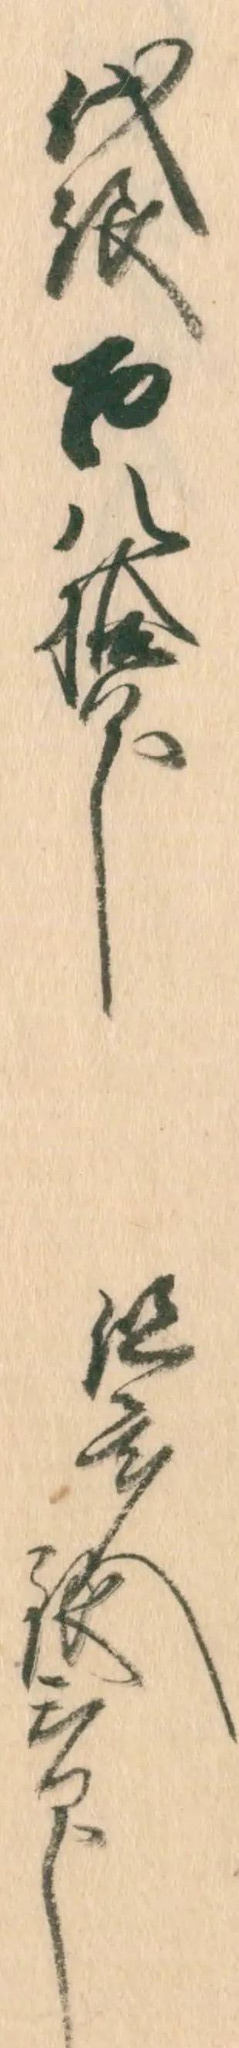代銀百八拾匁但壱人銀参匁
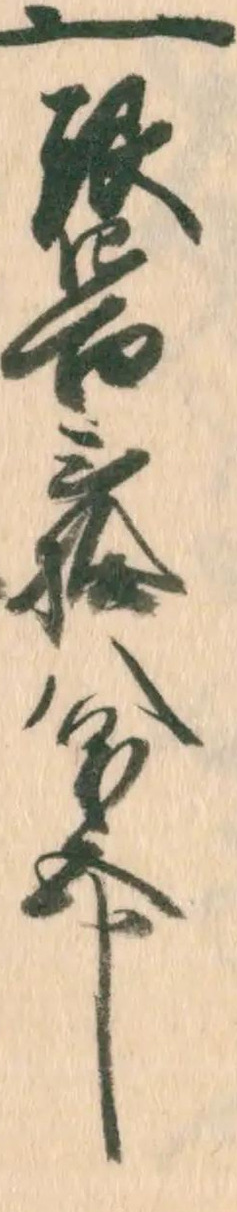銀四百三拾八匁五分
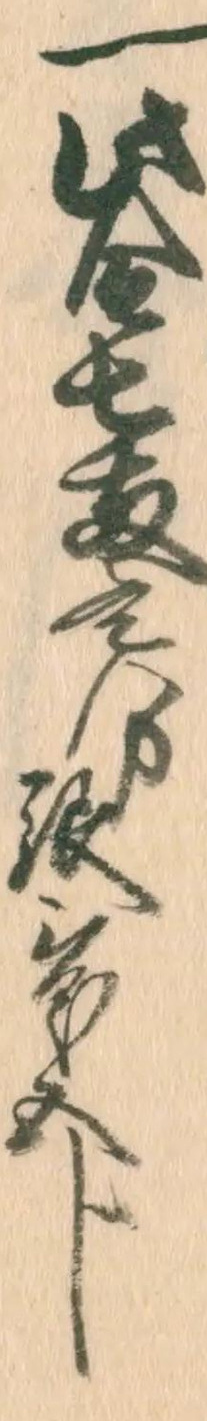此金七両壱分銀三匁五分
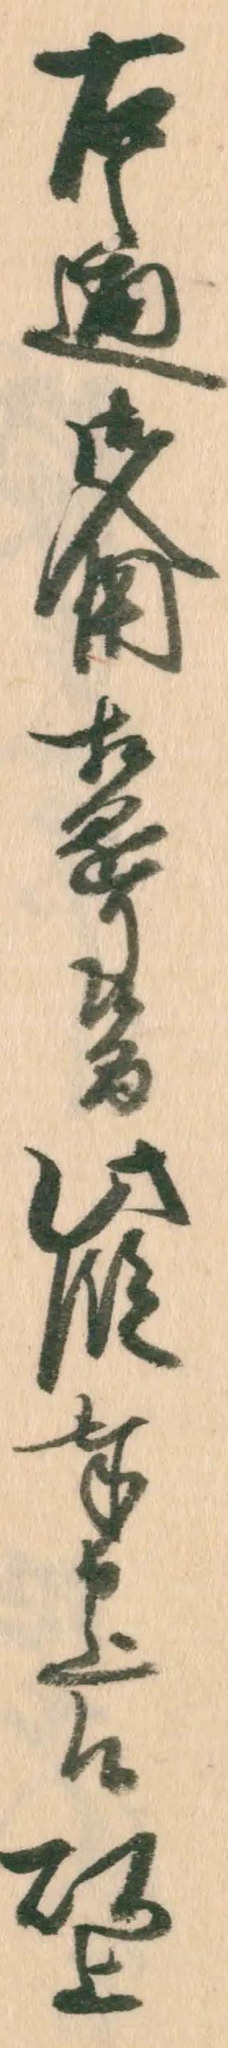右之通御入用相懸り候間此段奉申上候以上
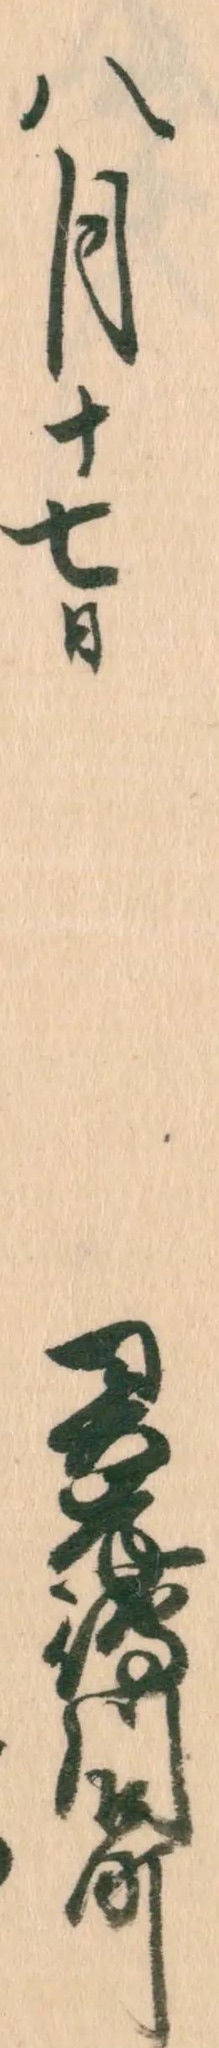八月十七日霊岸嶋川口町
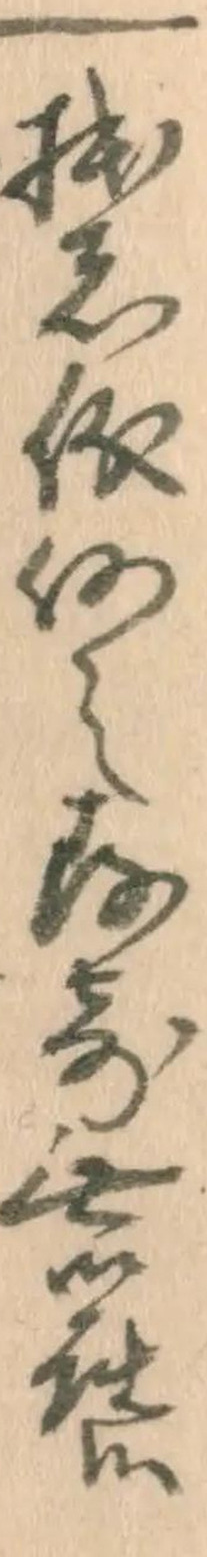拙者儀何之存寄無御座候
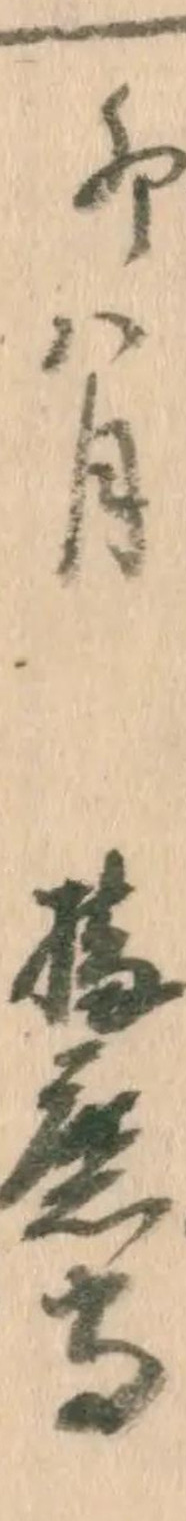卯八月播磨守
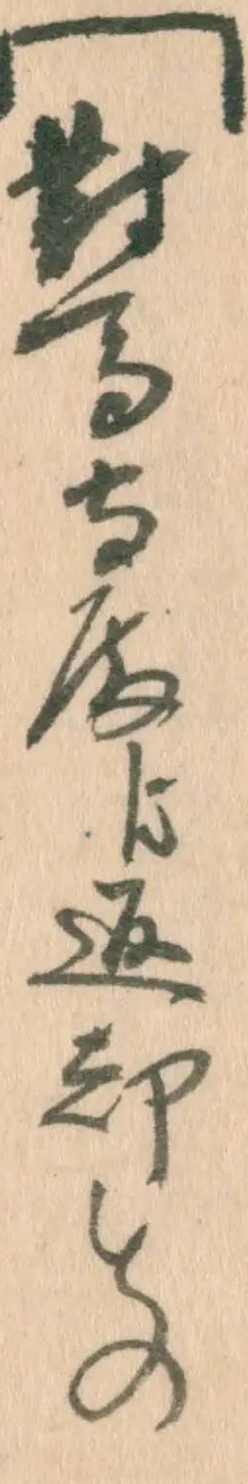対馬守殿え返却もの
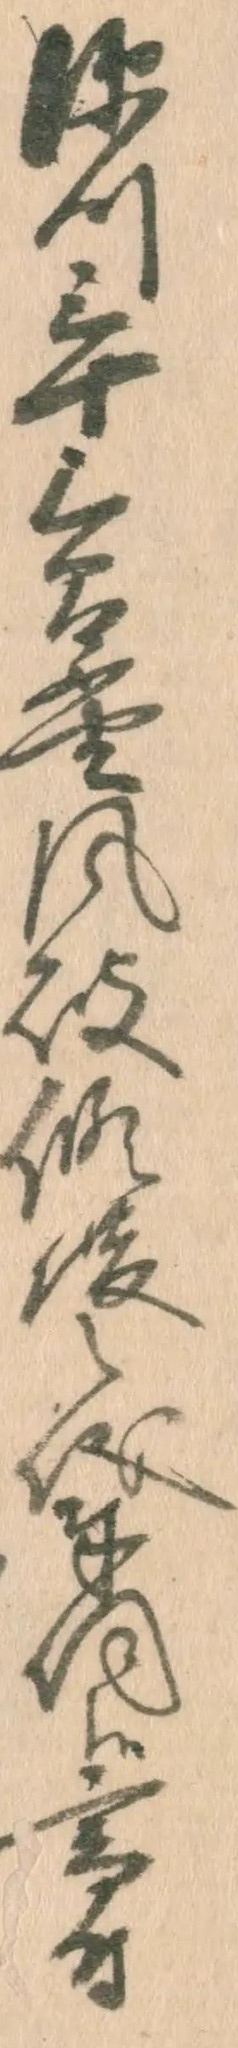深川三十三間堂風破修復之儀奉伺候書付
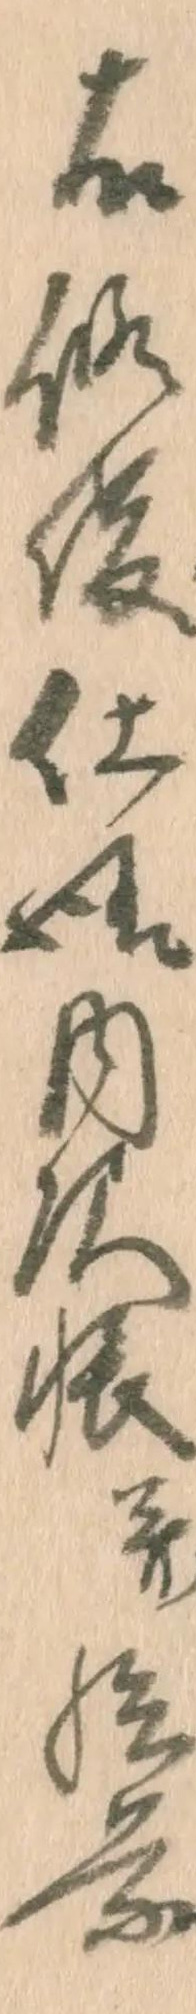右修復仕様内訳帳并絵図

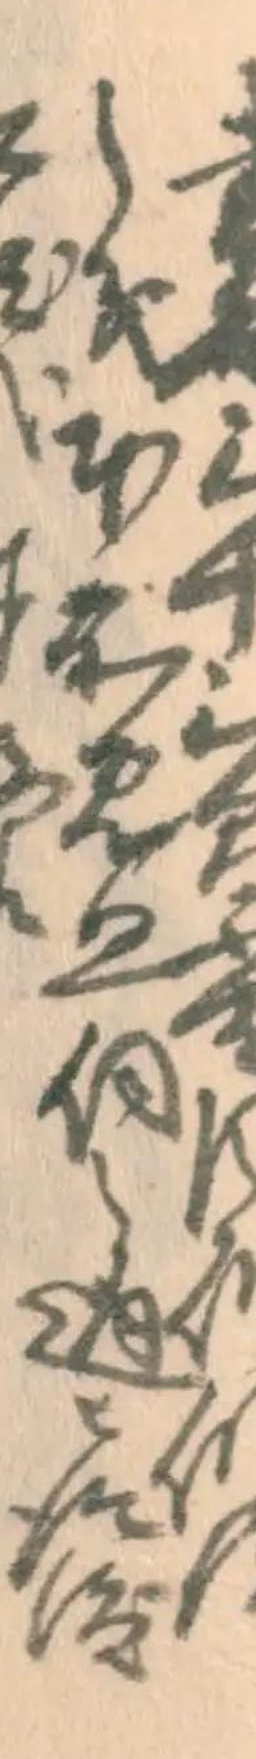之義本所見廻伺之通被仰渡
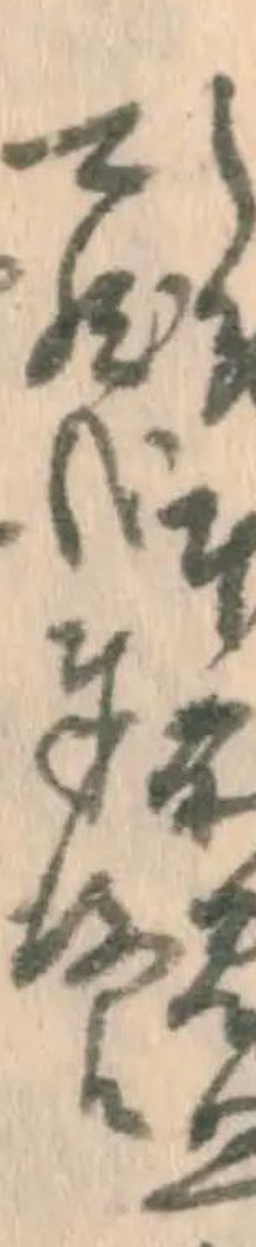可然哉奉存候
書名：三十三間堂. [1]
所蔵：国立国会図書館 National Diet Library, JAPAN
